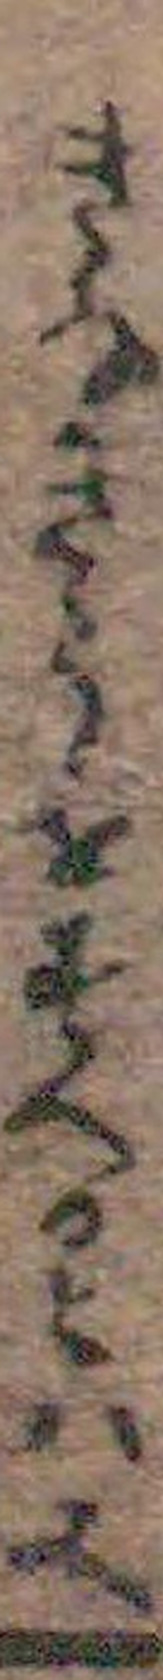きなきうをすへるとは又
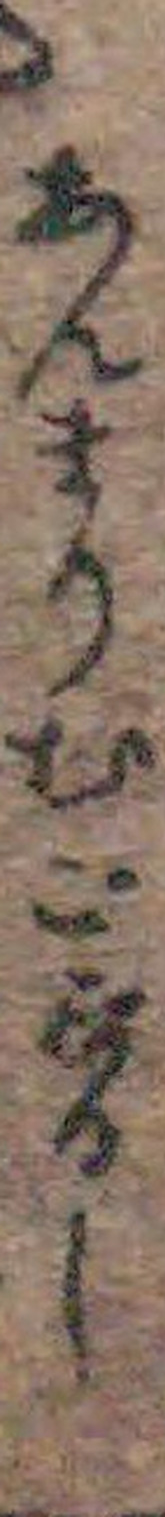あんまりむごじるし
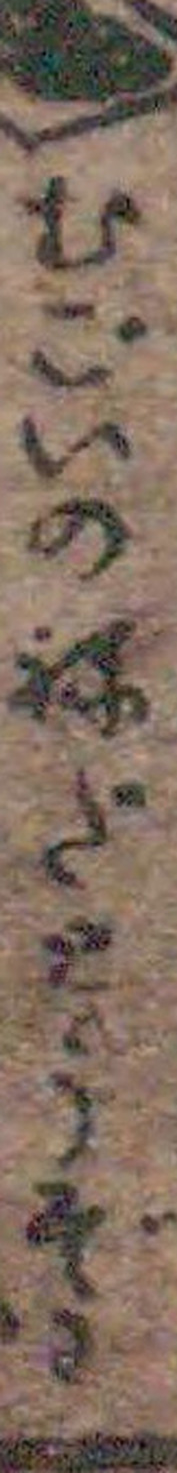むごいのねだとうぞわ
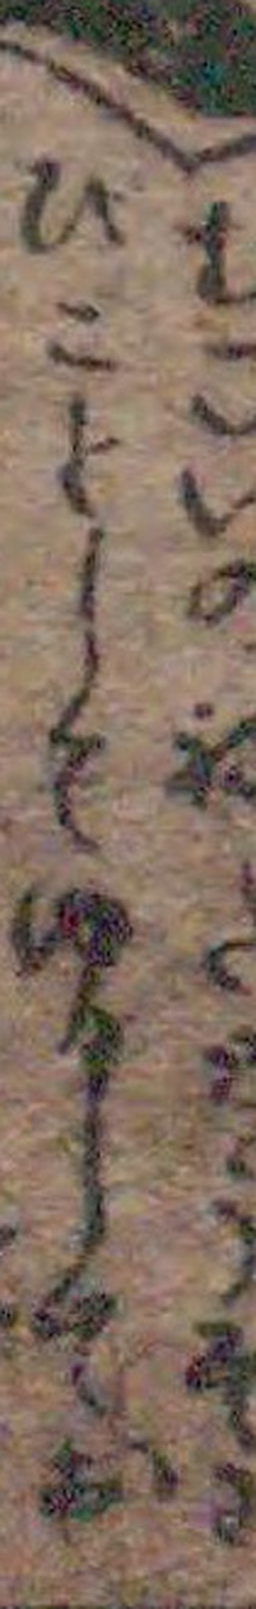びことしてゆるしてお
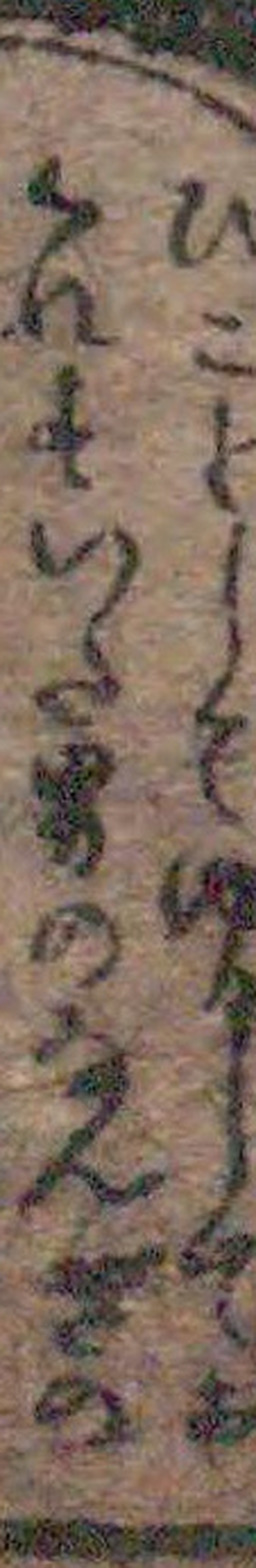くれすいた男のなんぎの
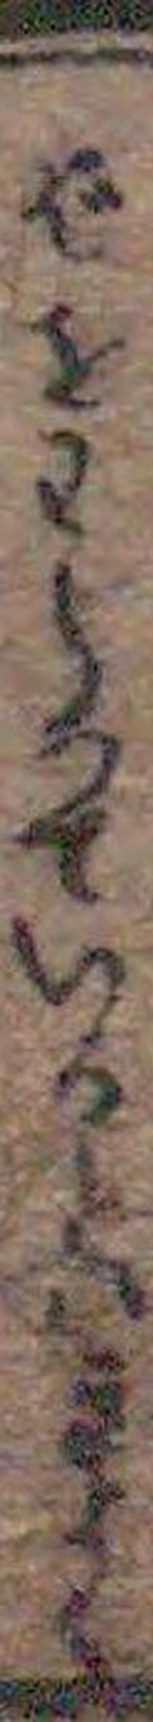ばをわらつているとはきよく
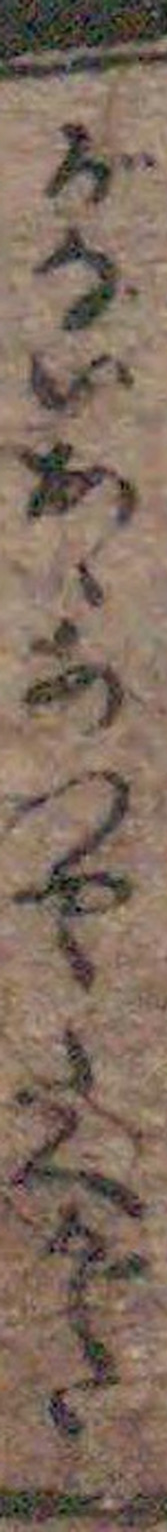がないあゝあつやたへがた
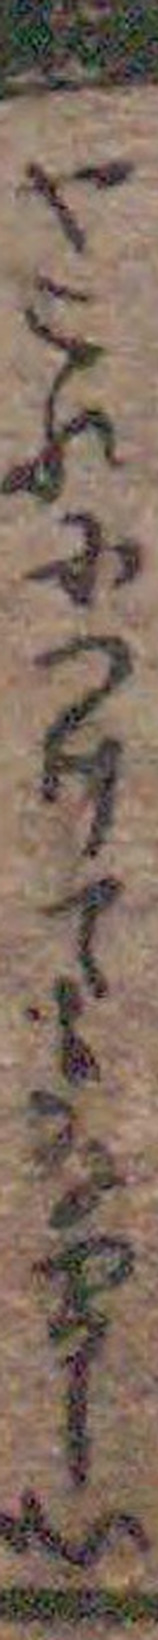やこれにつけてもなつかしい
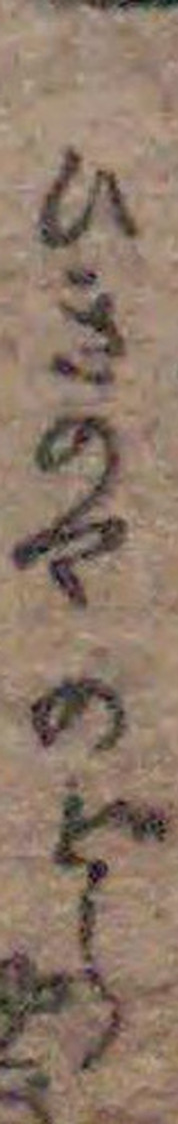ひきのやのどら
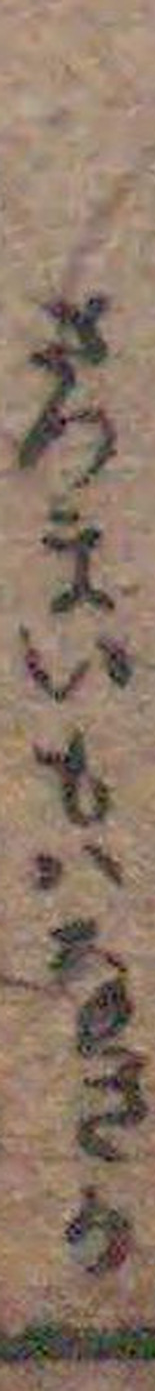さつまいもはなきか
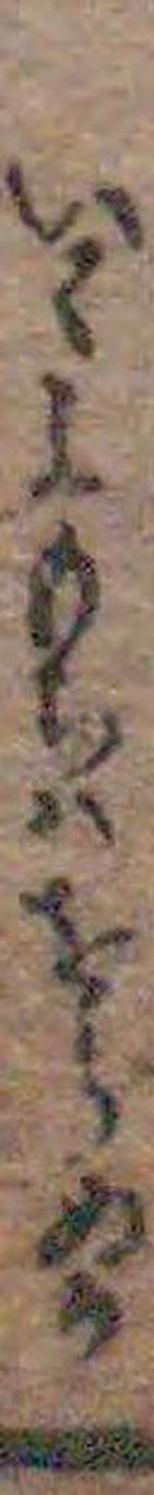いくよもちはをらぬか
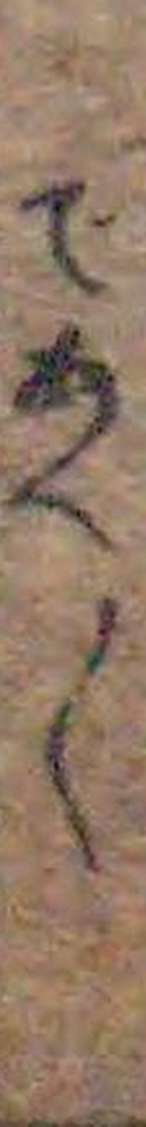であへ〳〵

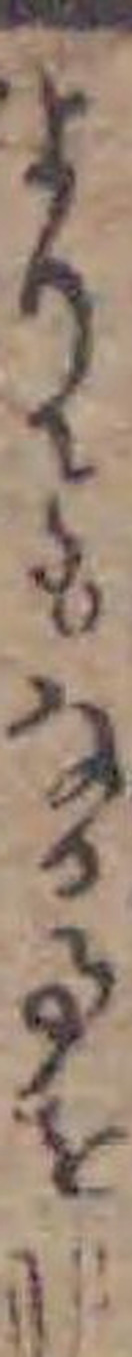よりともなる事を
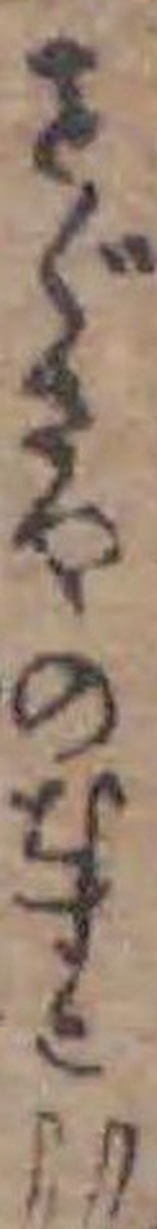もぐさやのむすこ
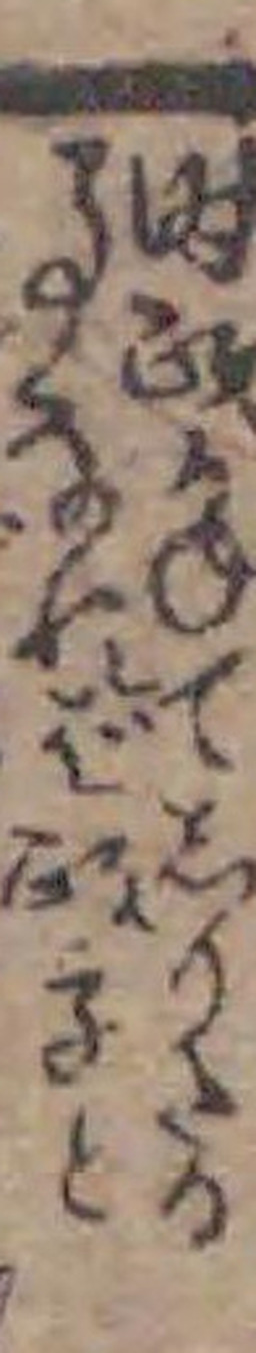事なれば政子と
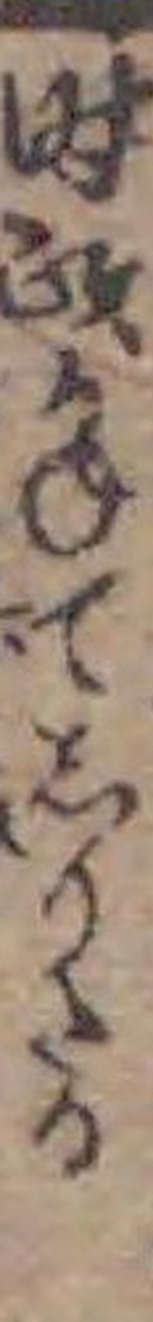時政かねてしりたる
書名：三舛増鱗組 : 3巻
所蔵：国立国会図書館 National Diet Library, JAPAN
